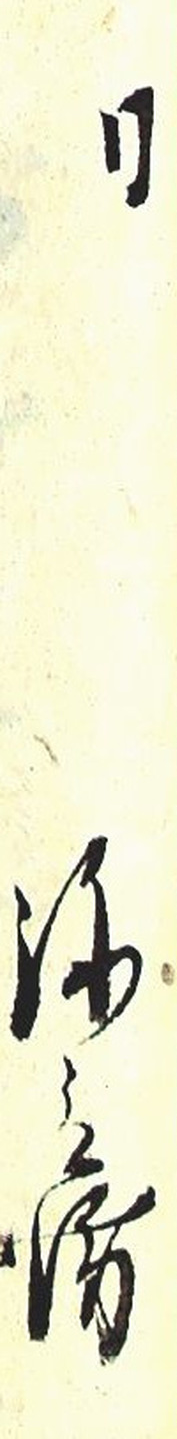同弥兵衛
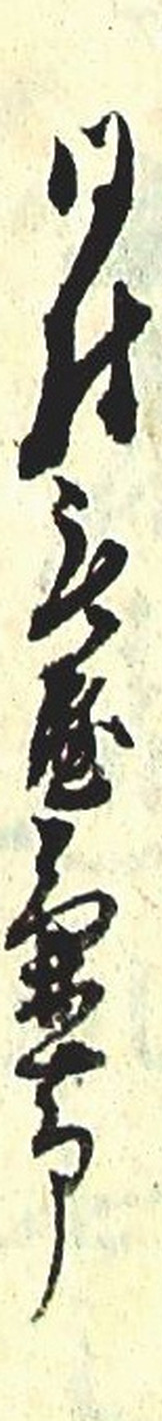同村庄屋兼帯
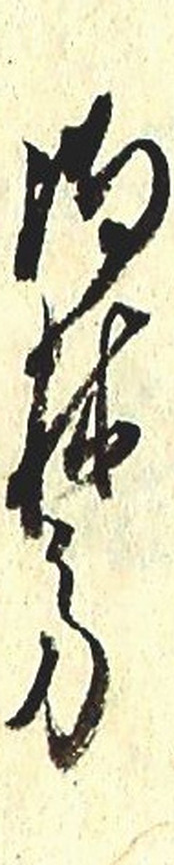御林方
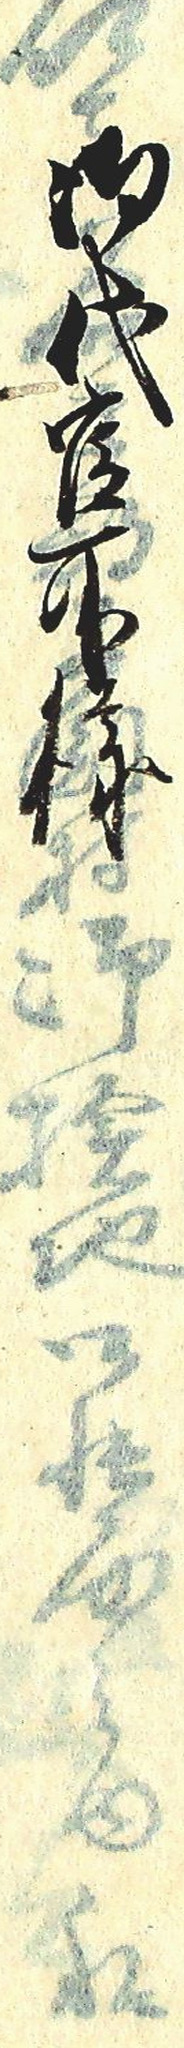御代官所様
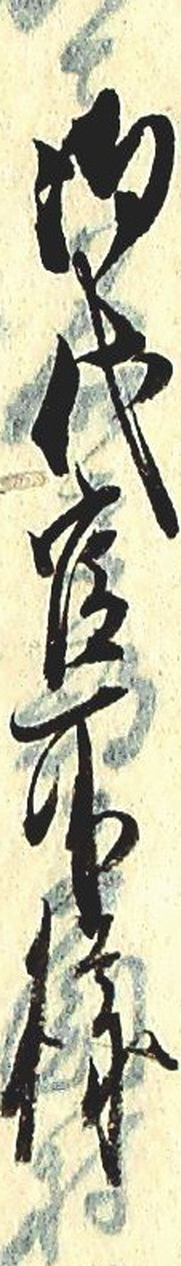御代官所様
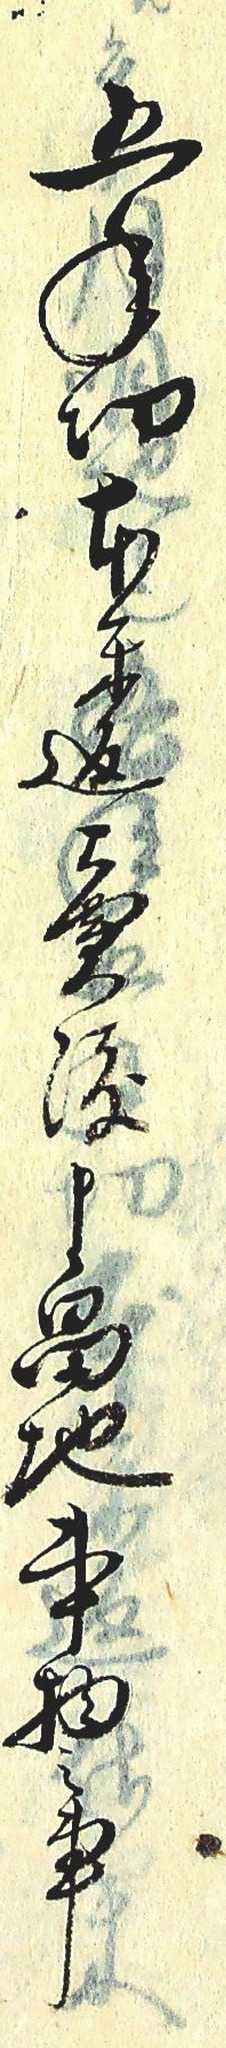五年切本米返売渡申畠地書物之事
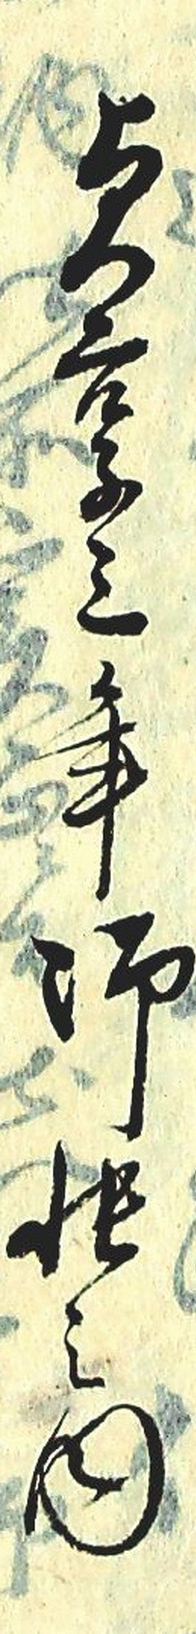貞享三年御帳之内
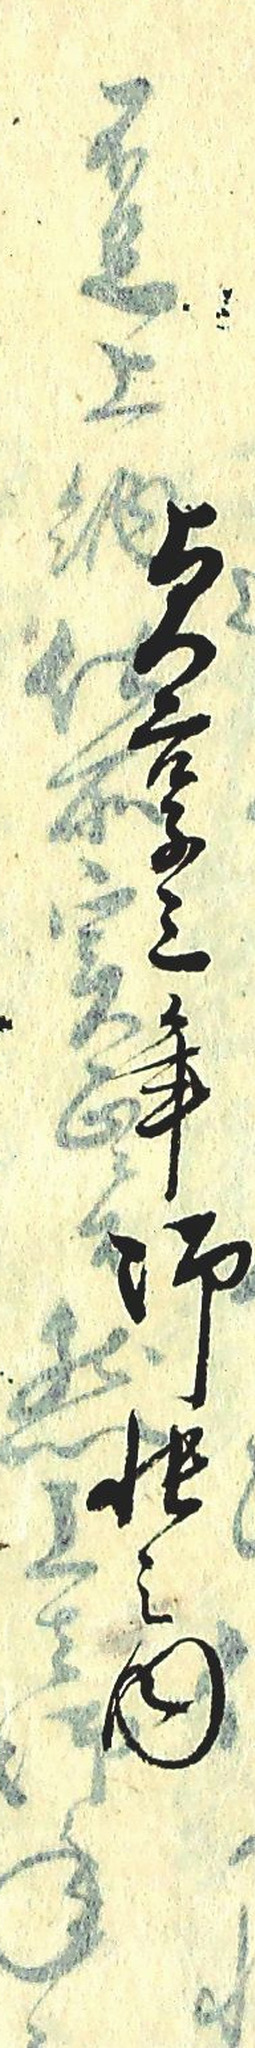貞享三年御帳之内
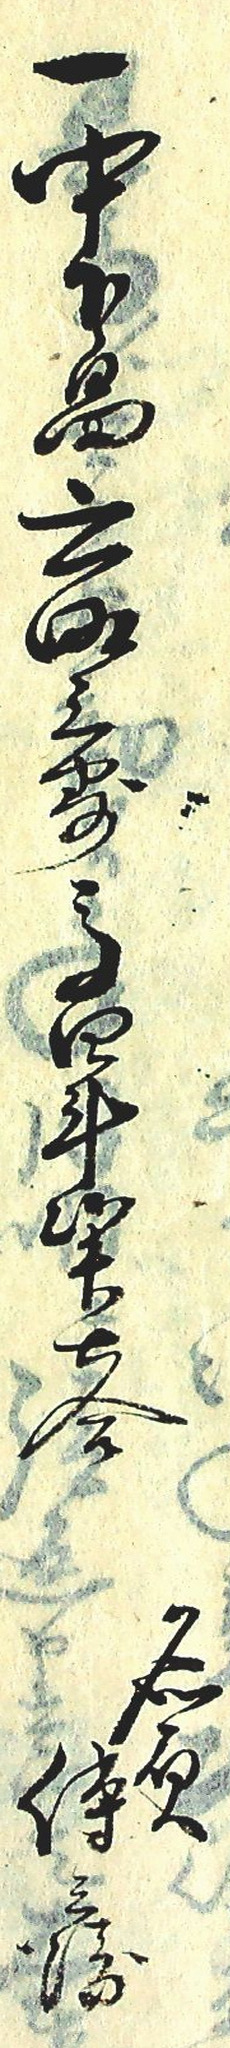一中下畠六畝三歩高四斗弐升七合伝兵衛
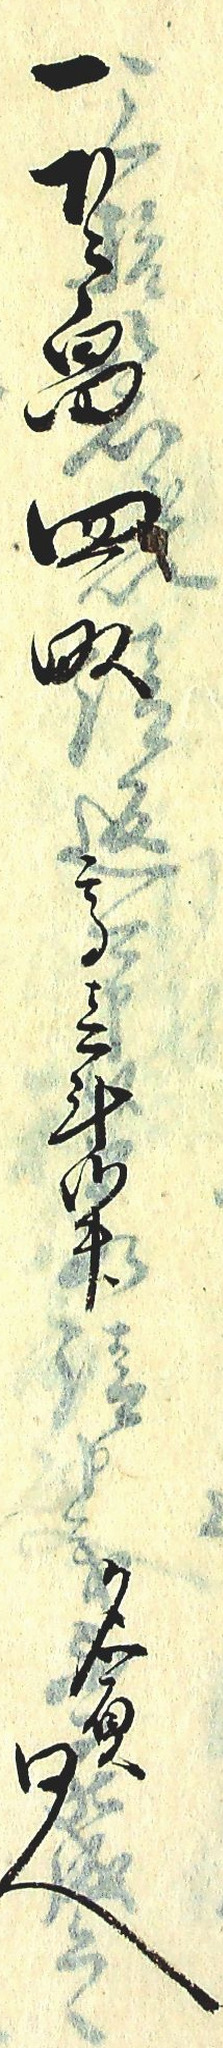一下々畠四畝高壱斗弐升同人
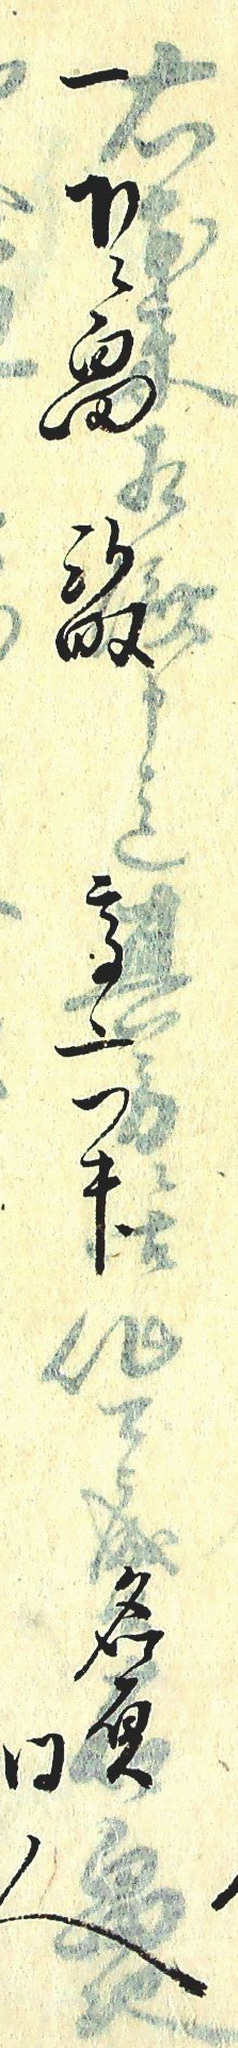一下々畠弐畝高六升同人
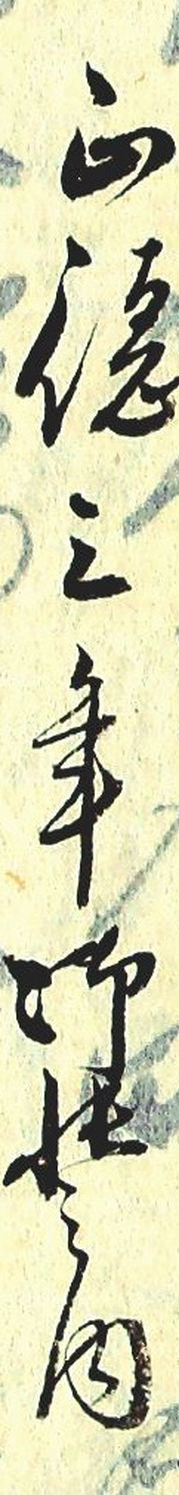正徳三年御帳之内
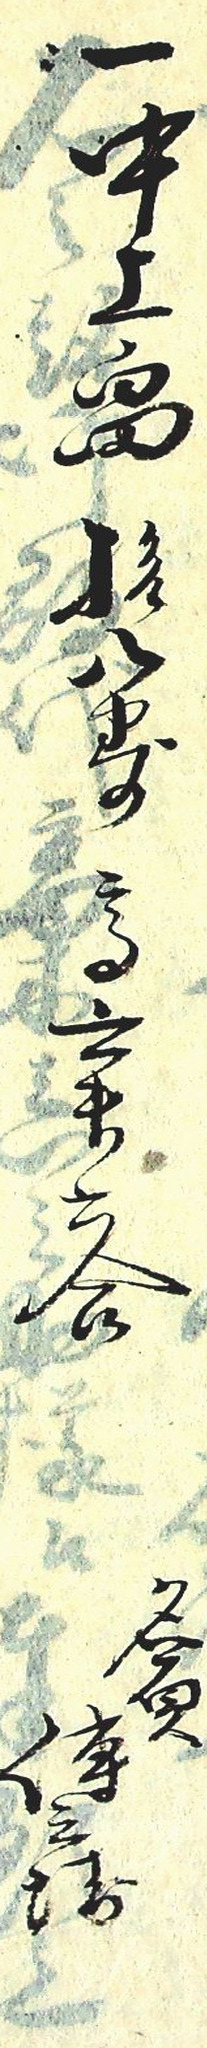一中上畠拾八歩高六升六合伝兵衛
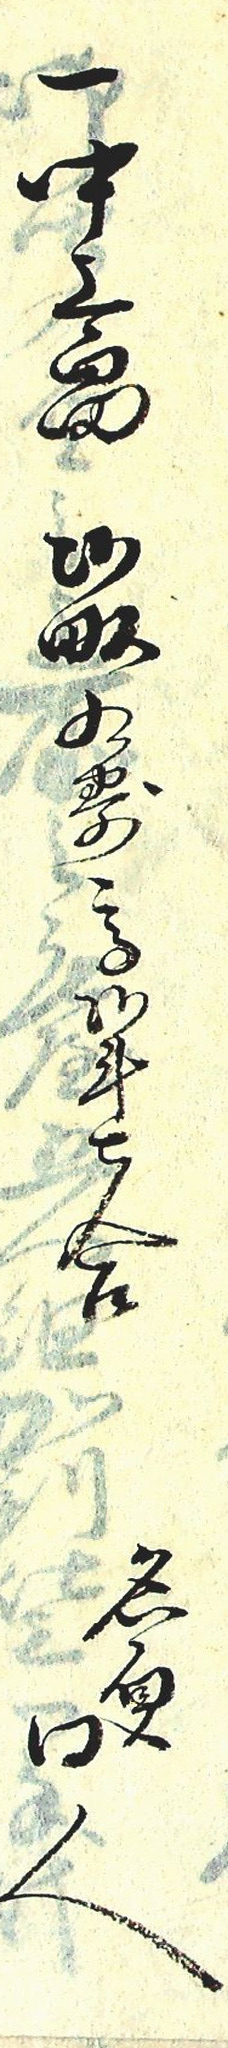一中上畠弐畝九歩高弐斗七合同人
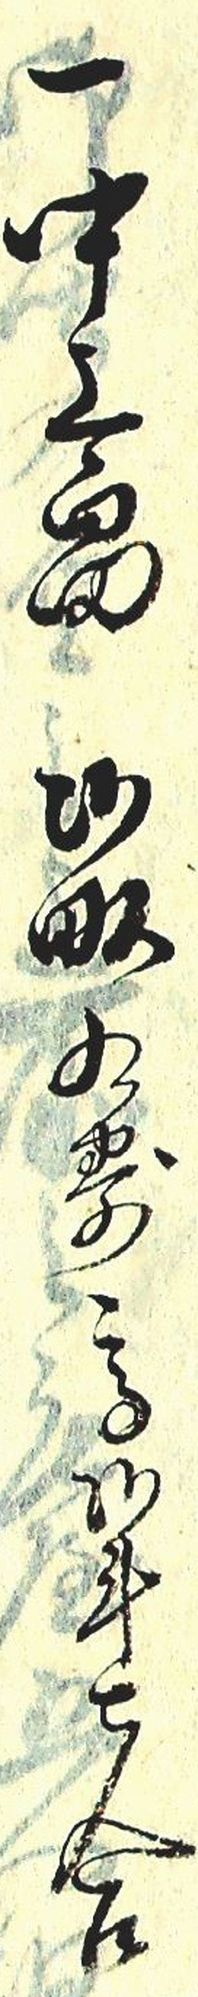一中上畠弐畝九歩高弐斗七合同人

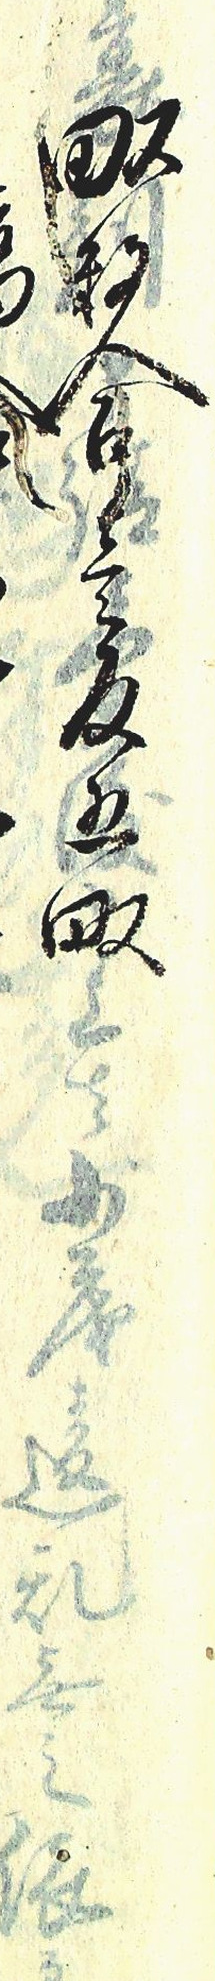畝数合壱反五畝
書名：諸御願書控(弐番）
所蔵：鳴門教育大学 Naruto University of Education
